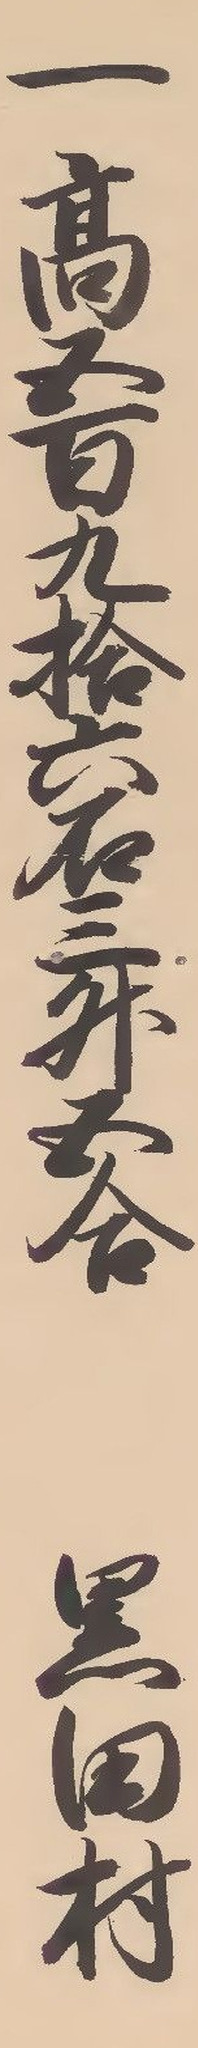一高五百九拾六石三升五合黒田村

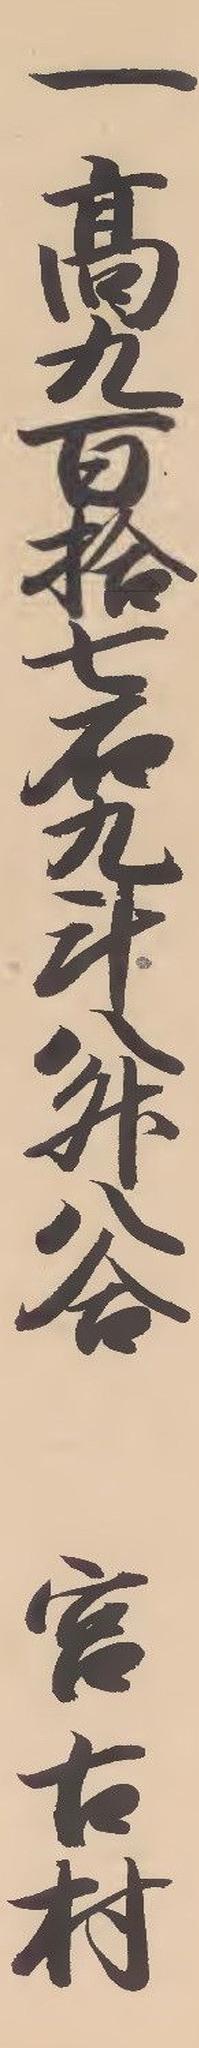一高九百拾七石九斗八升八合宮古村
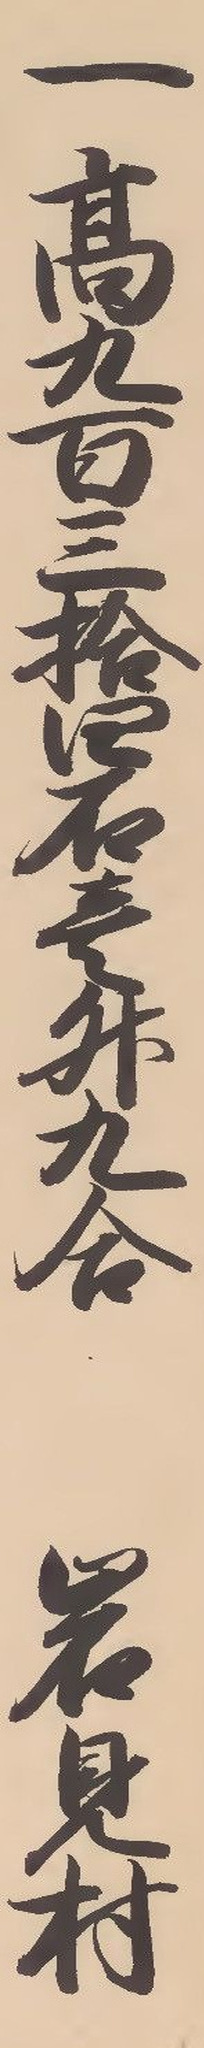一高九百三拾四石壱升九合岩見村
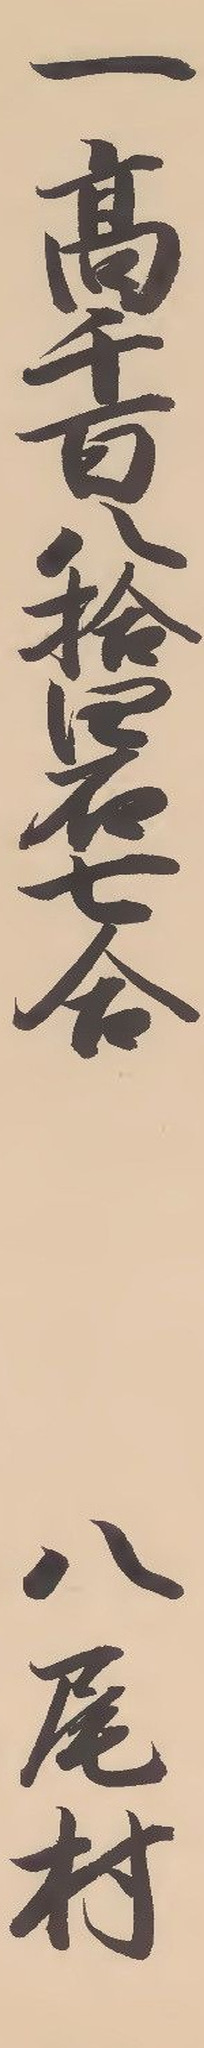一高千百八拾四石七合八尾村
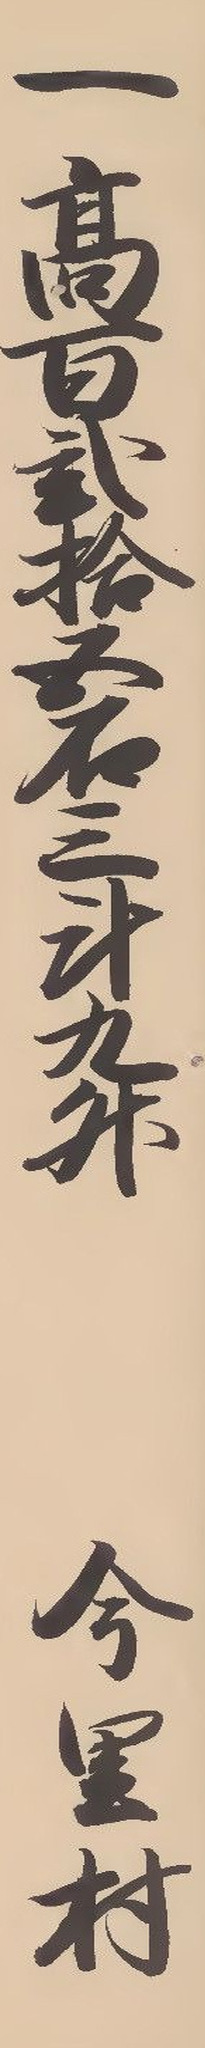一高百弐拾五石三斗九升今里村
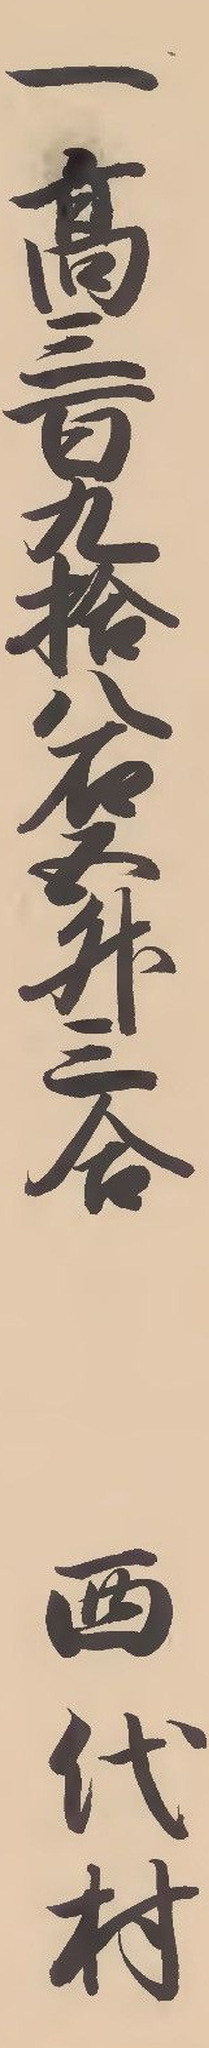一高三百九拾八石五升三合西代村
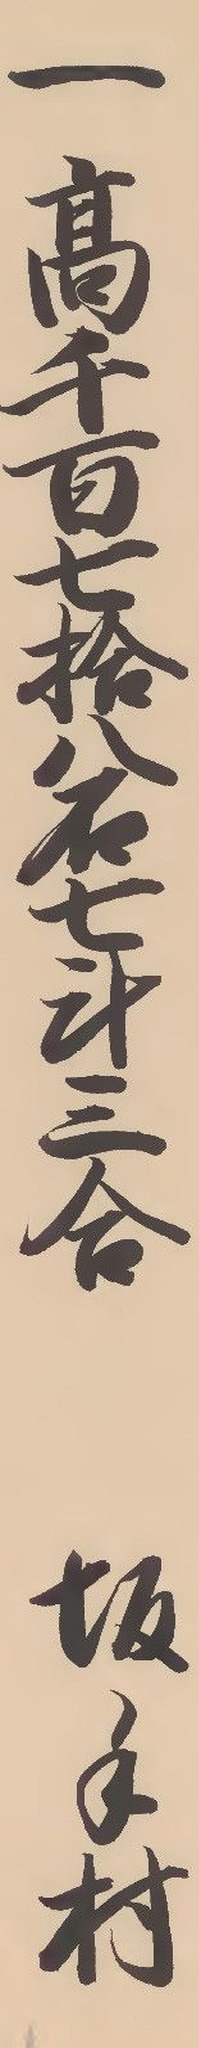一高千百七拾八石七斗三合坂手村
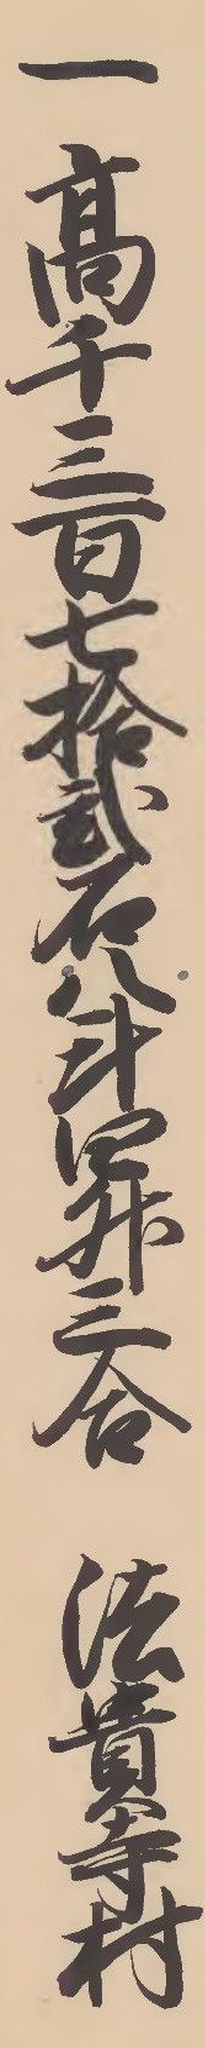一高千三百七拾弐石八斗四升三合法貴寺村

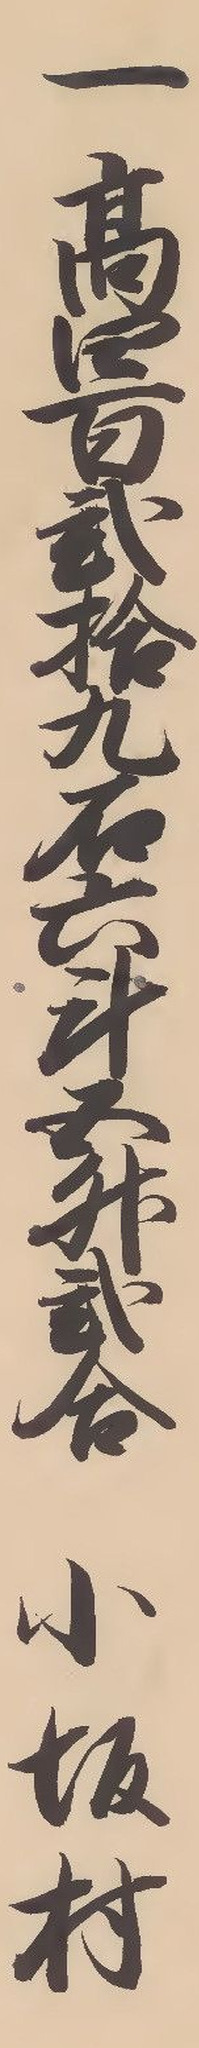一高四百弐拾九石六斗五升弐合小坂村
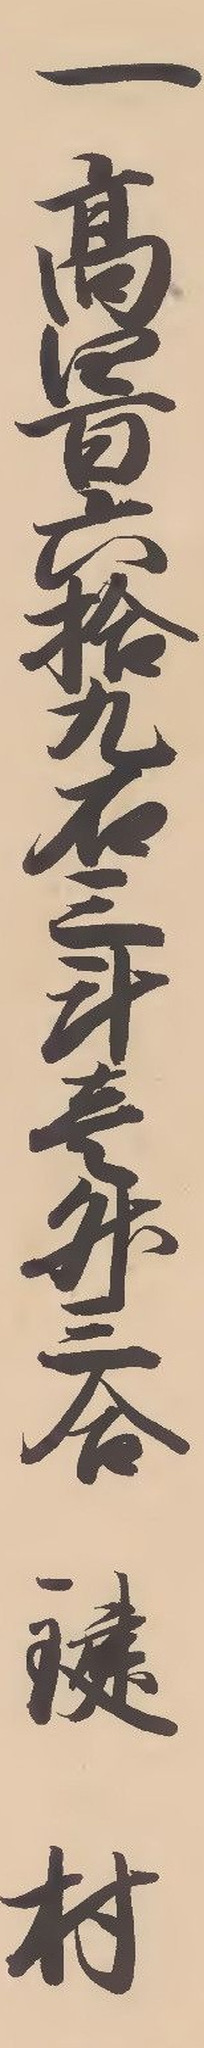一高四百六拾九石三斗壱升三合鍵村
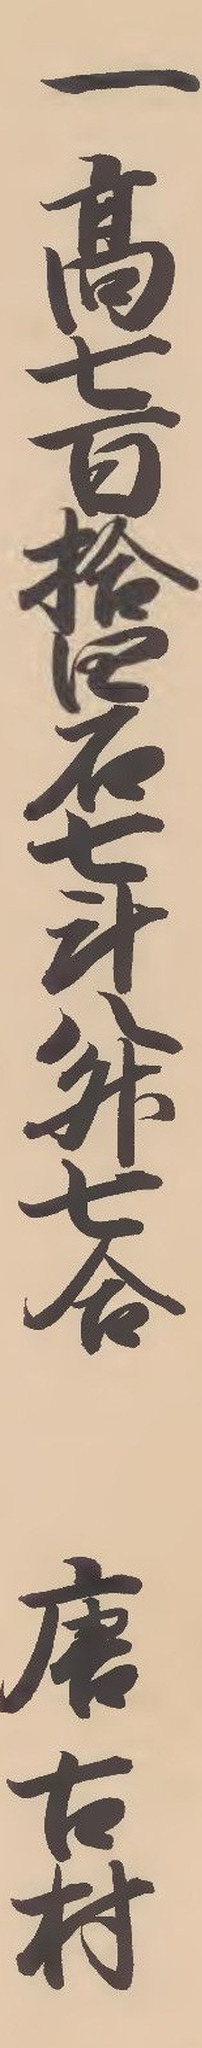一高七百拾四石七斗八升七合唐古村
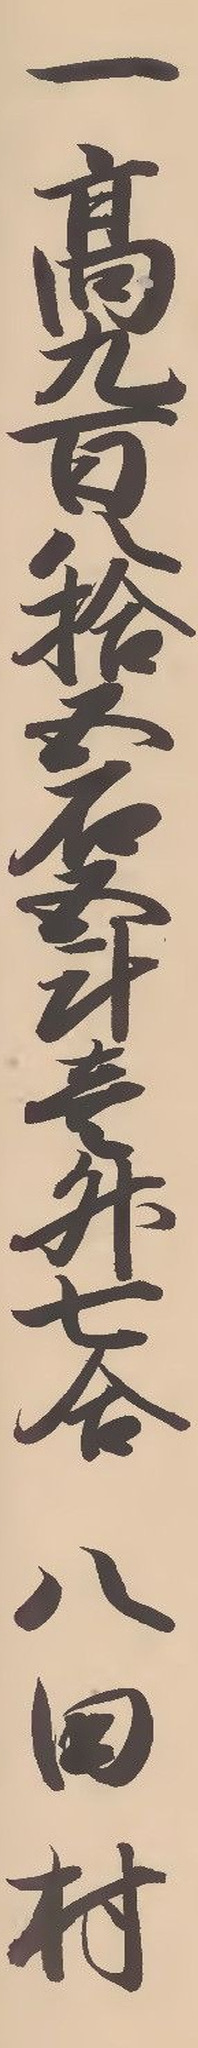一高九百八拾五石五斗壱升七合八田村
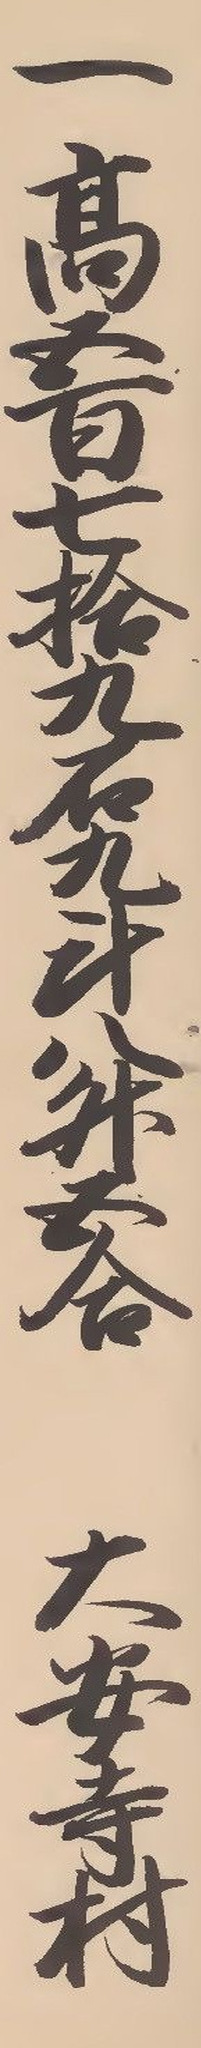一高五百七拾九石九斗八升五合大安寺村
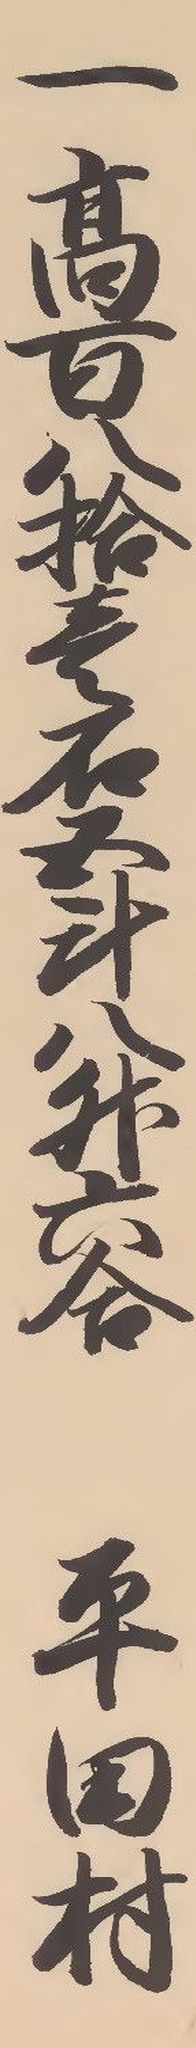一高百八拾壱石五斗八升六合平田村
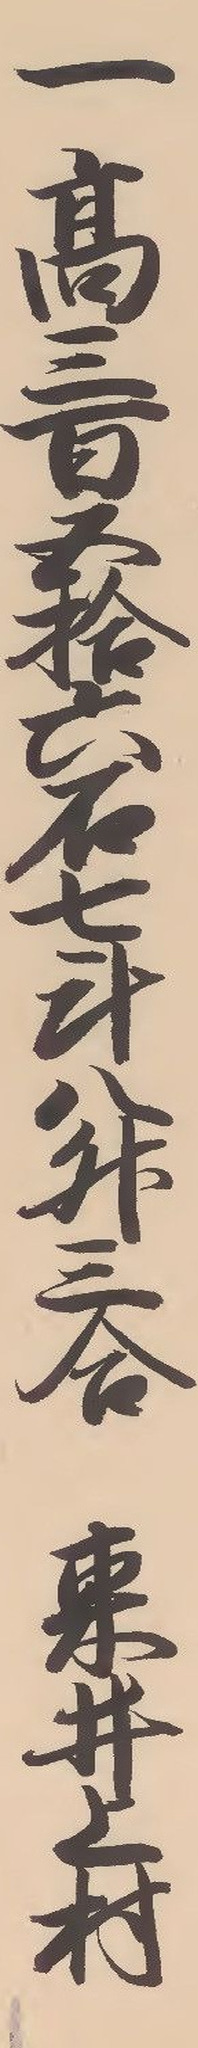一高三百五拾六石七斗八升三合東井上村
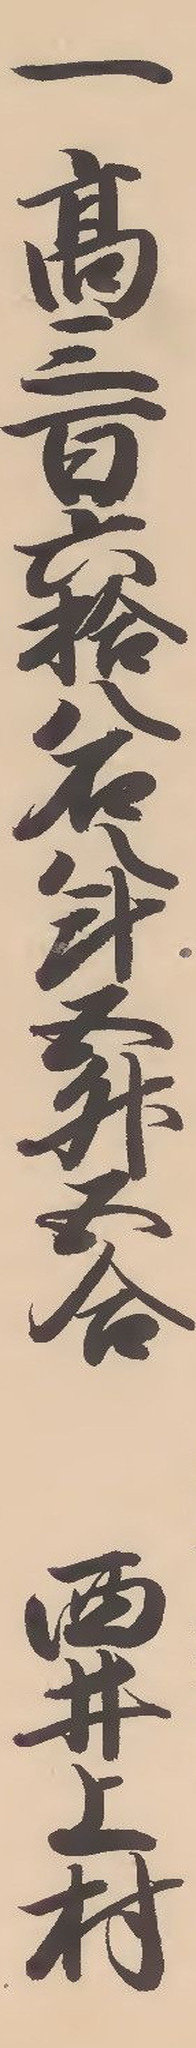一高三百五拾六石七斗八升三合東井上村
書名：大和国郷帳
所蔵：国立公文書館 National Archives of Japan
